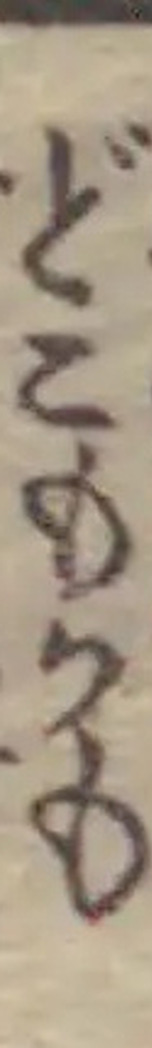どこもかも
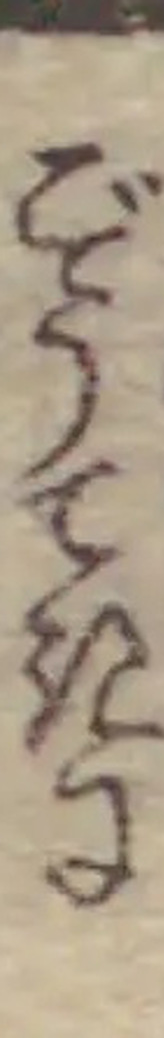ごうてきに
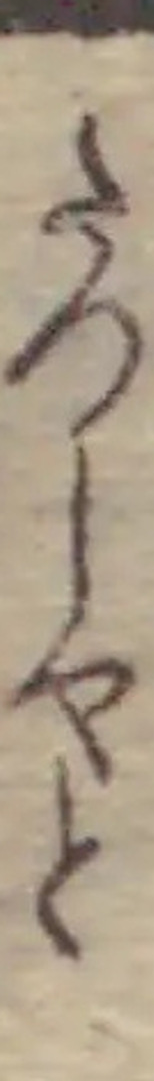たつしやと
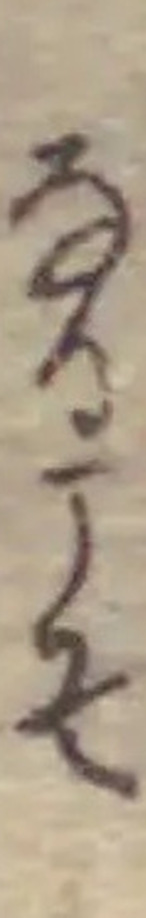なる丁そ
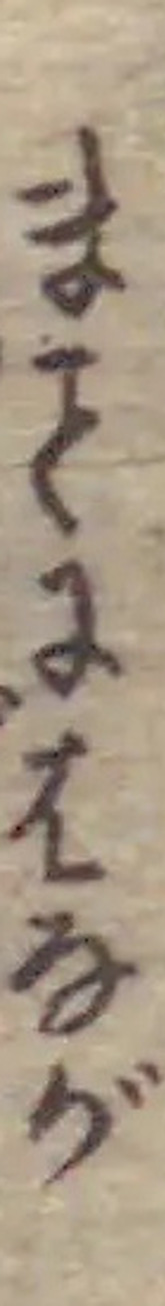まことにはなが
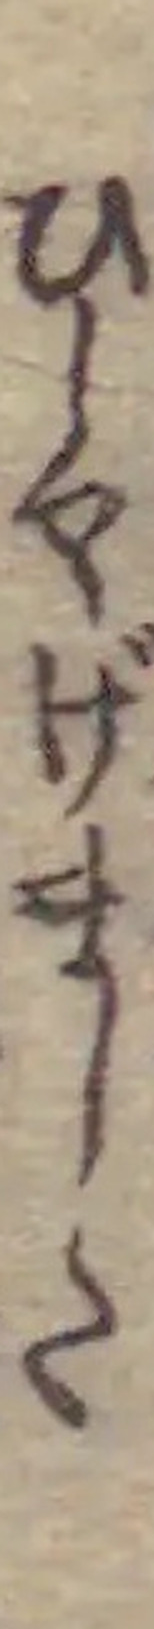ひしやげました

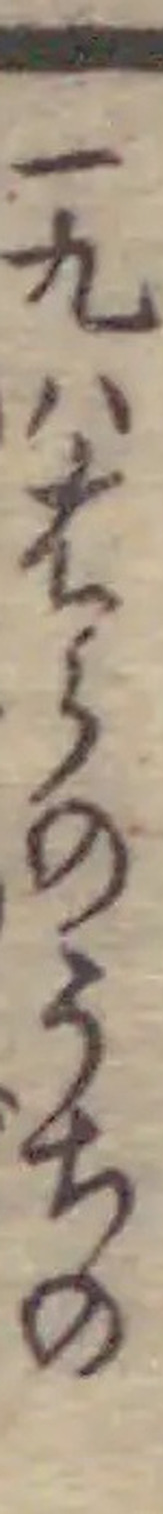一九ははらのうちの
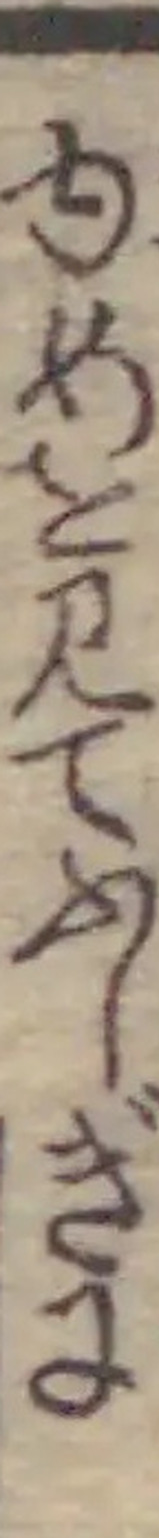ゆめを見てふしぎに
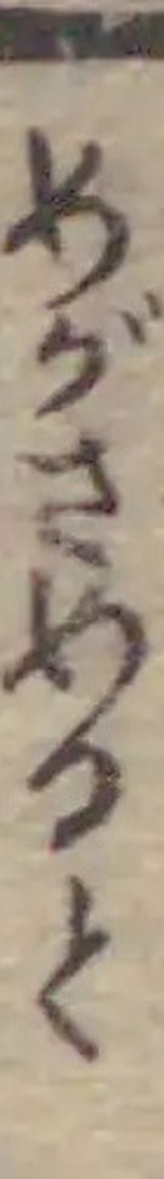めがさめると
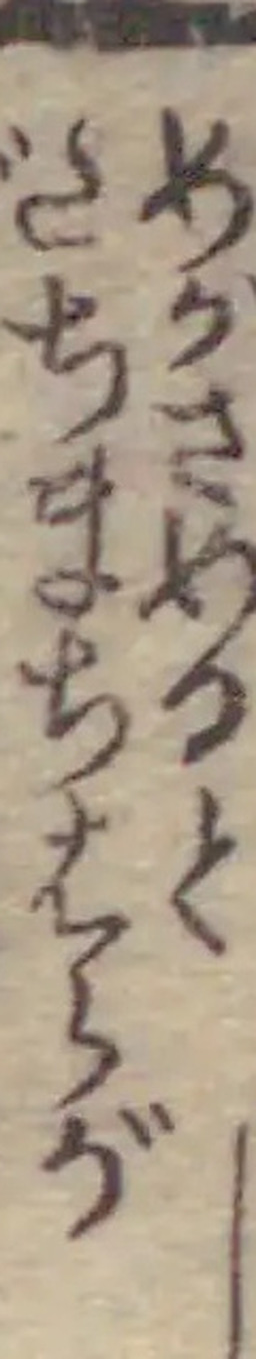たちまちはらが
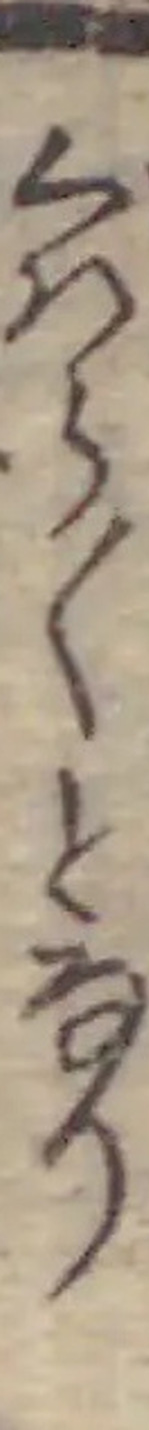ぐはら〳〵となり
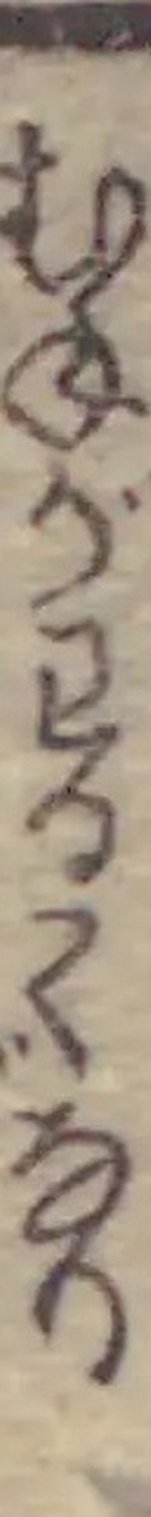むねがわるくなり
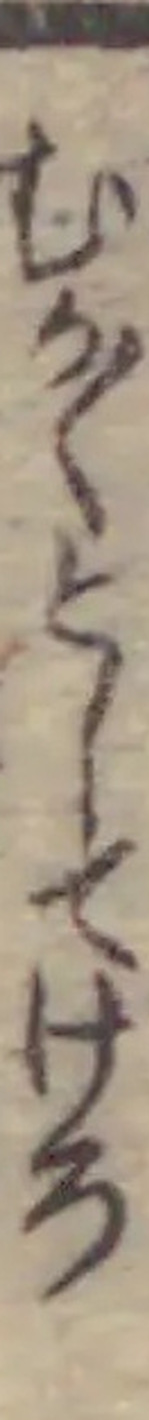むか〳〵としてげろ
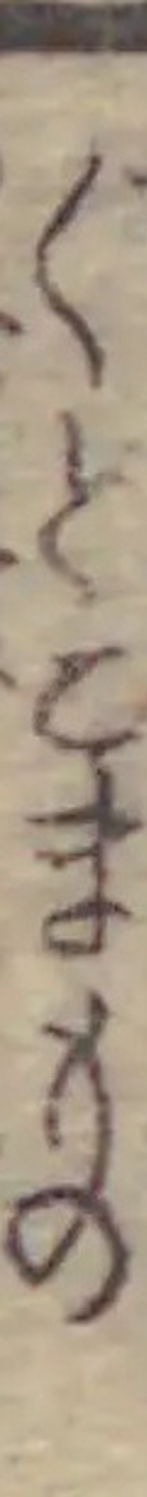〳〵とこまもの
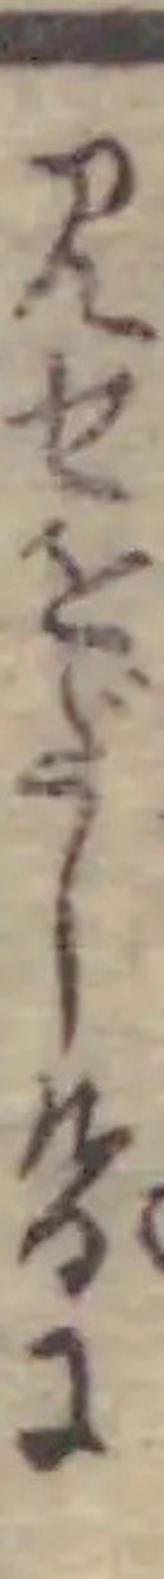見せをだしけるに
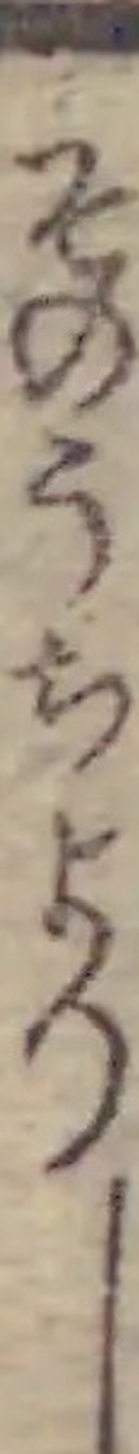そのうちより
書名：腹内養生主論 3巻
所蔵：国立国会図書館 National Diet Library, JAPAN
